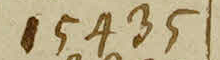15435
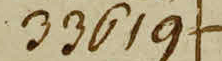33619
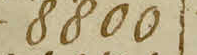8800
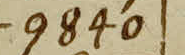9840
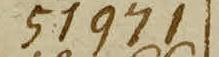51971
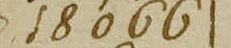18066
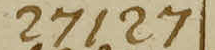27127
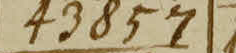43857
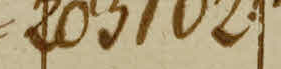203102
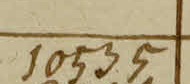10535
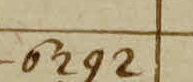6292
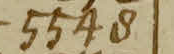5548
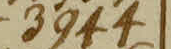3944
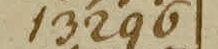13296
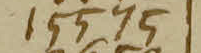15575
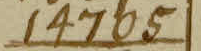14705
